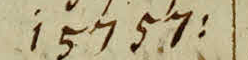15757:
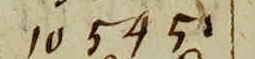10545:
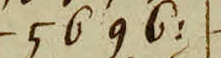5696:
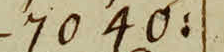7040:
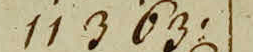11363:
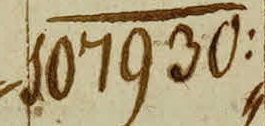107930:
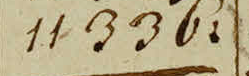11336:
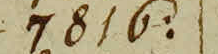7816:
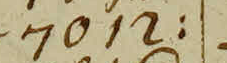7012:
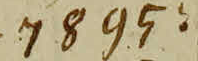7895
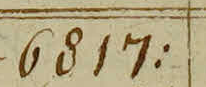6817:
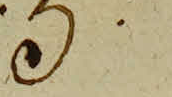5:
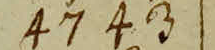4743
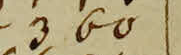360
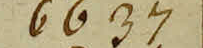6637
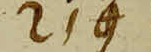219
